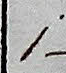1
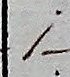1
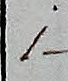1
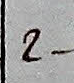2
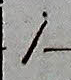1
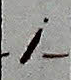1
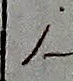1
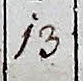13
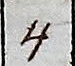4
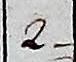2
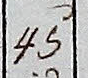45
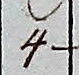4
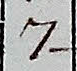7
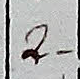2
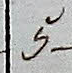5
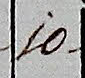10
